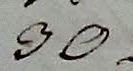30
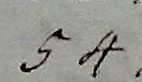54
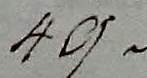49
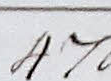47
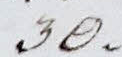30
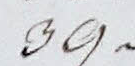39
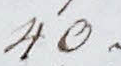40
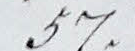57
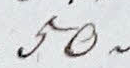50
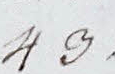43
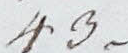43
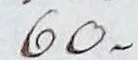60
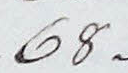68
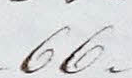66
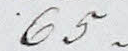65
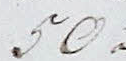50
